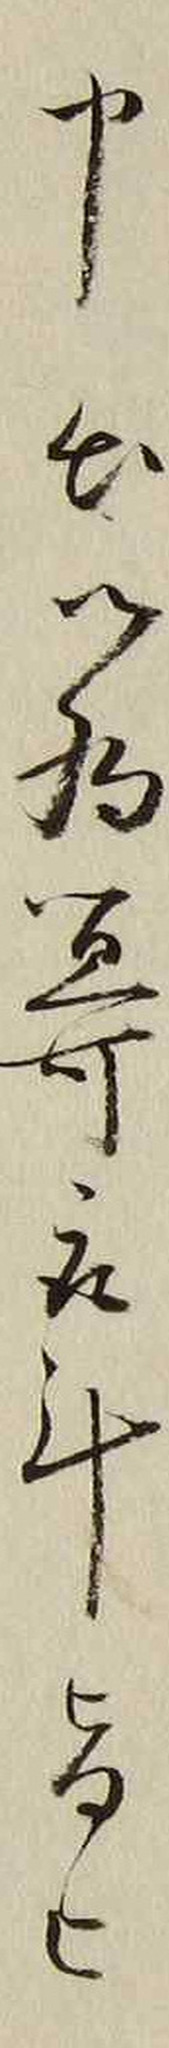申出候為宜可取斗旨被
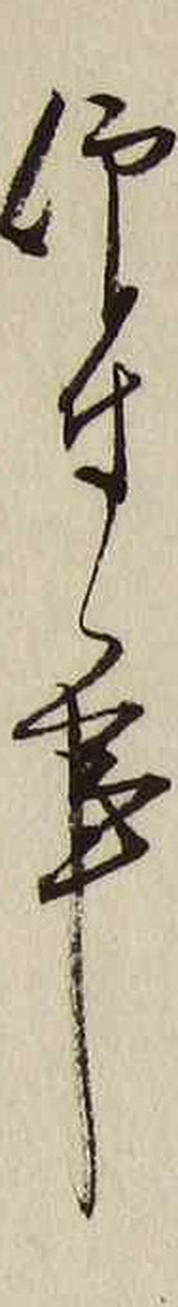仰付候事
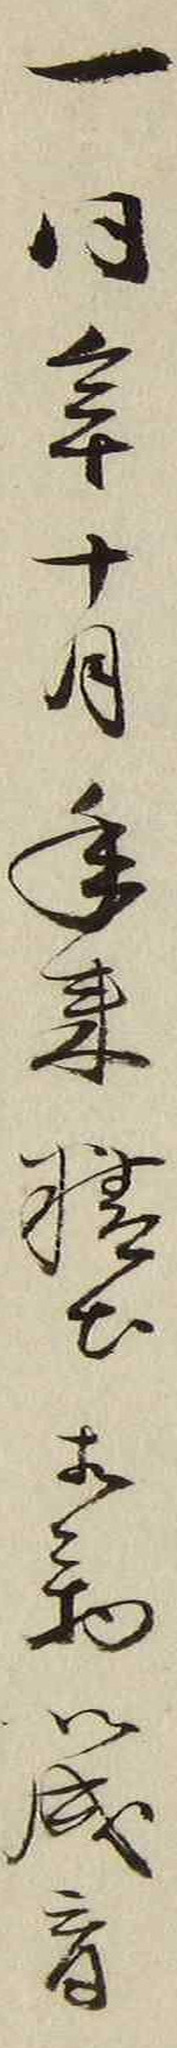一同年十月年來精出相勤御成育
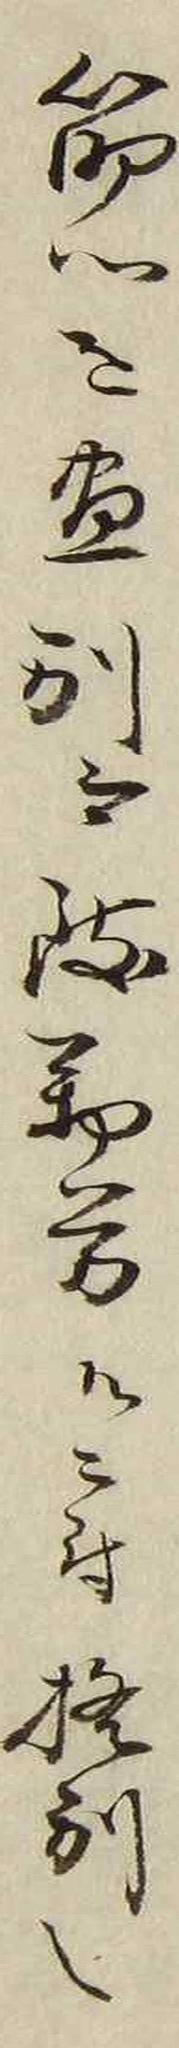筋心を尽別而致勤労候に付格別之

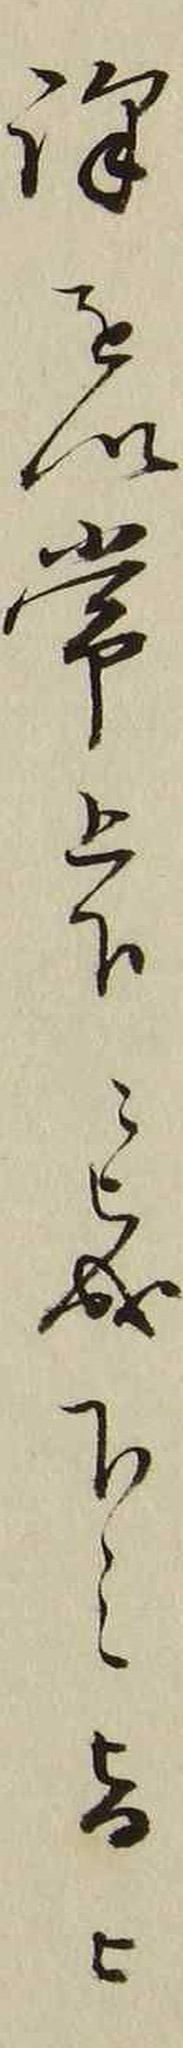譯を以常上下に被成下之旨被
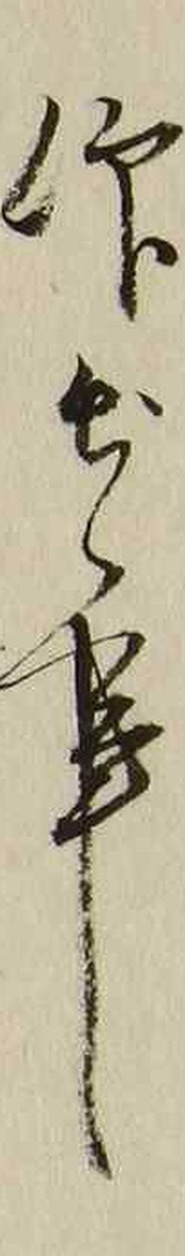仰出候事
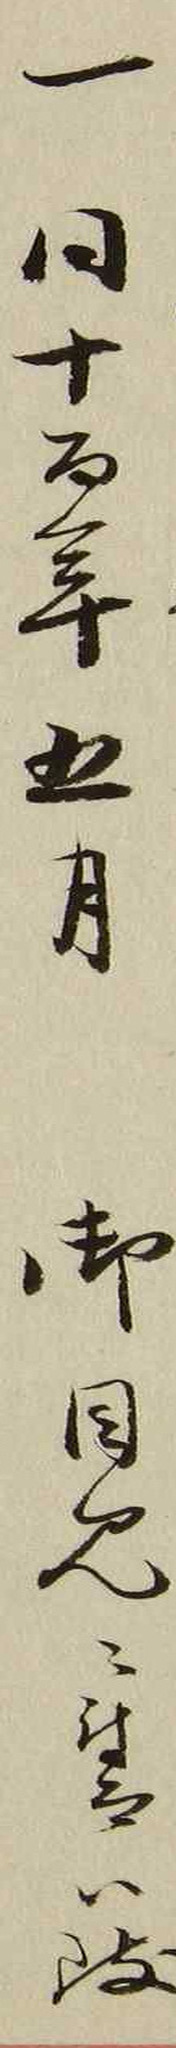一同十酉年五月御目見に付而は致
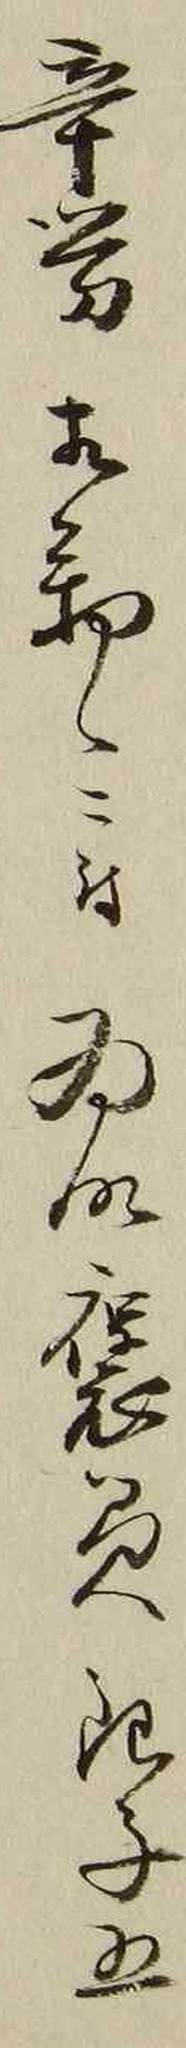辛労相勤候に付為御褒美銀子五
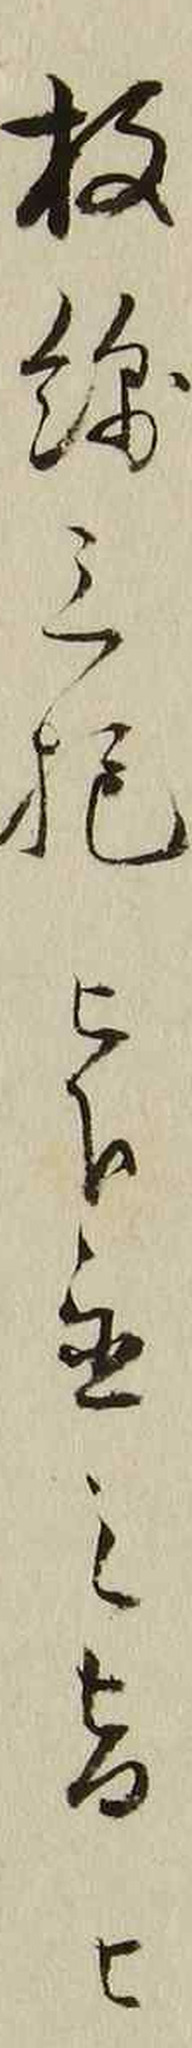枚綿三把被下置之旨被
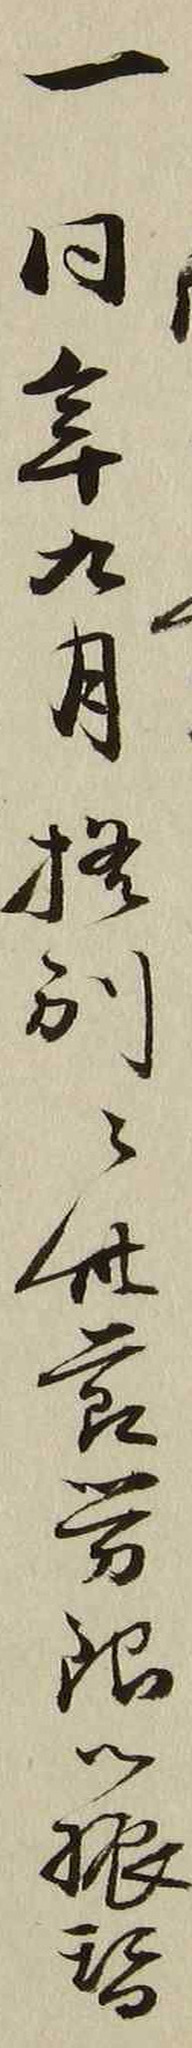一同年九月格別に此節労銀御振替
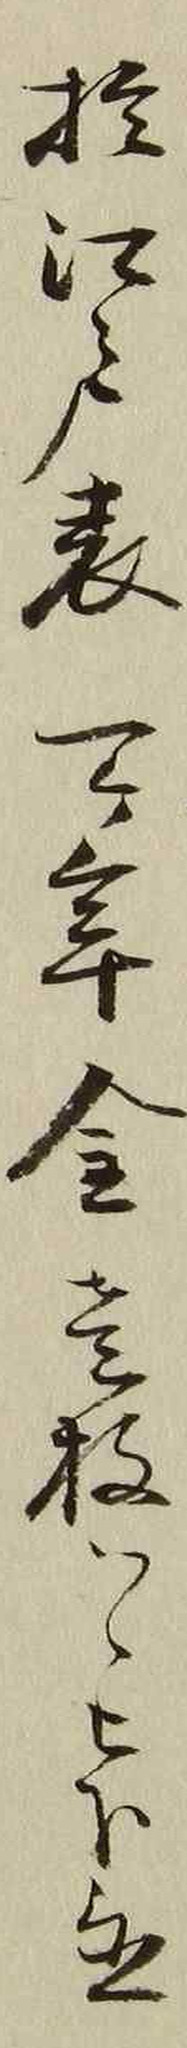於江戸表一ヶ年金壱枚つゝ被下置
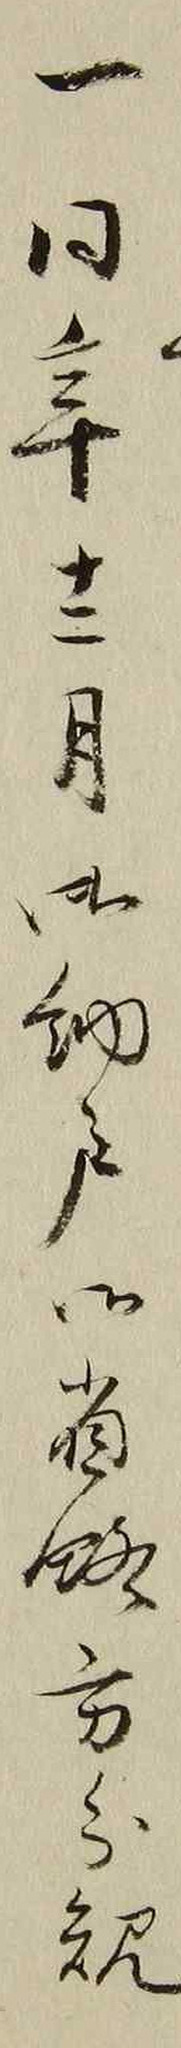一同年十二月御納戸御省略方分規
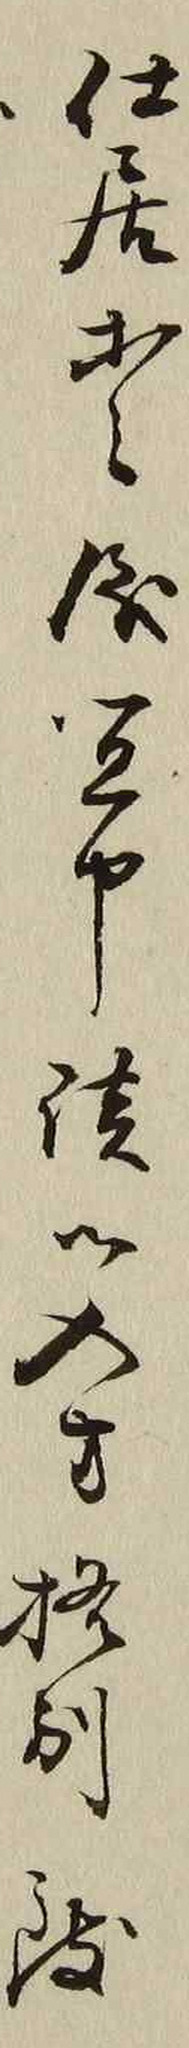仕居等之儀宜申談御入方格別致
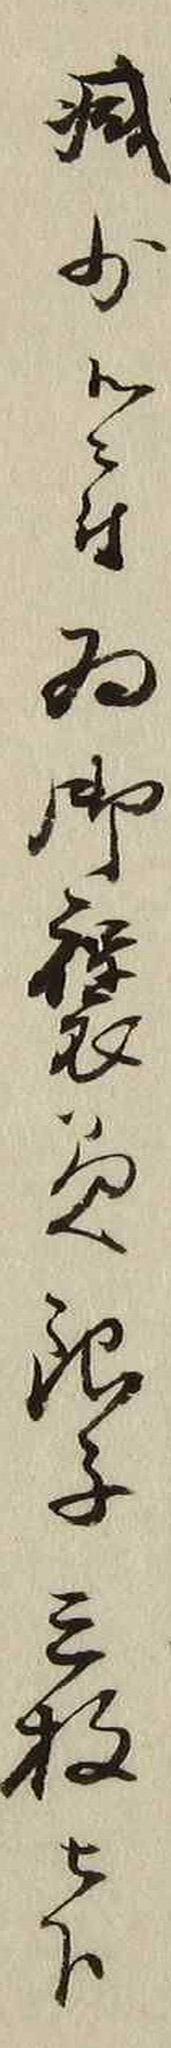減少候に付為御褒美銀子三枚被下
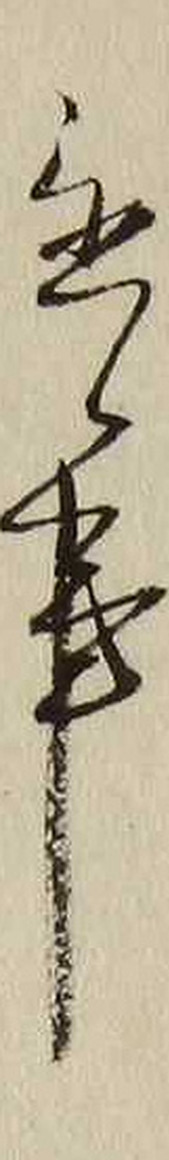置候事
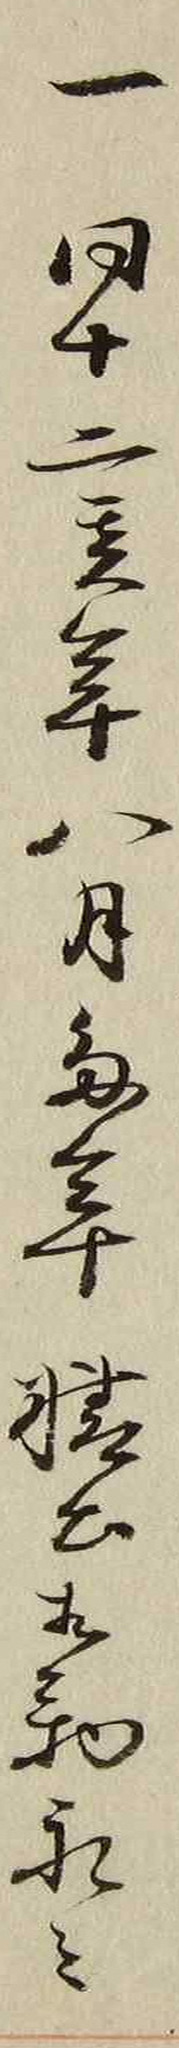一同十二亥年八月多年精出相勤永々
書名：諸士系譜　巻之292　き之部1
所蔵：会津若松市立会津図書館
